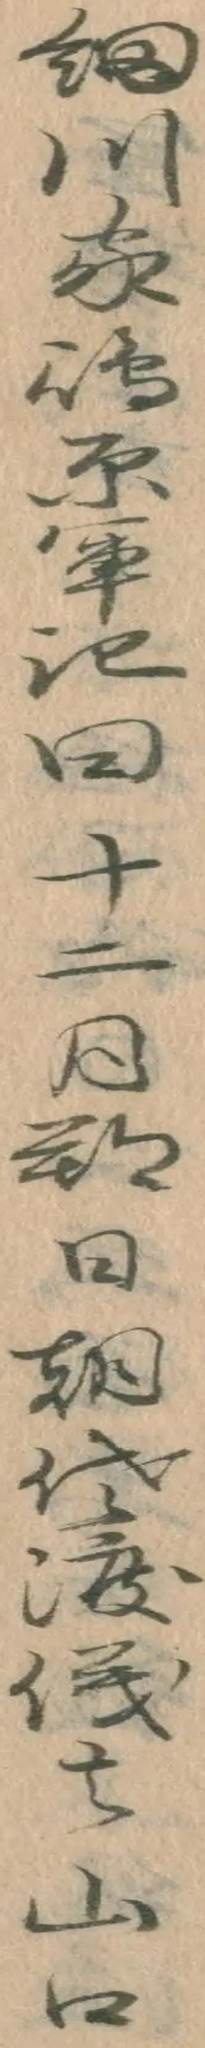細川家島原軍記曰十二月朔日朝佐渡儀は山口
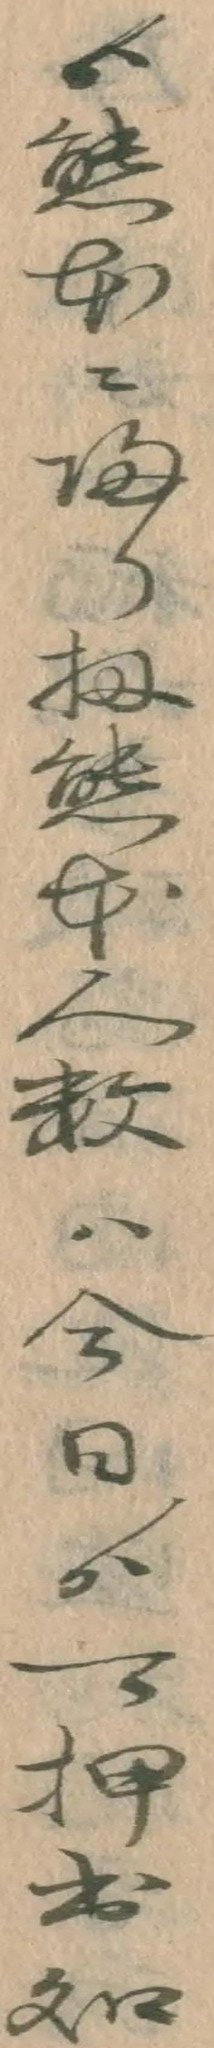ゟ熊本に帰り扨熊本人数は今日ゟ可押出処
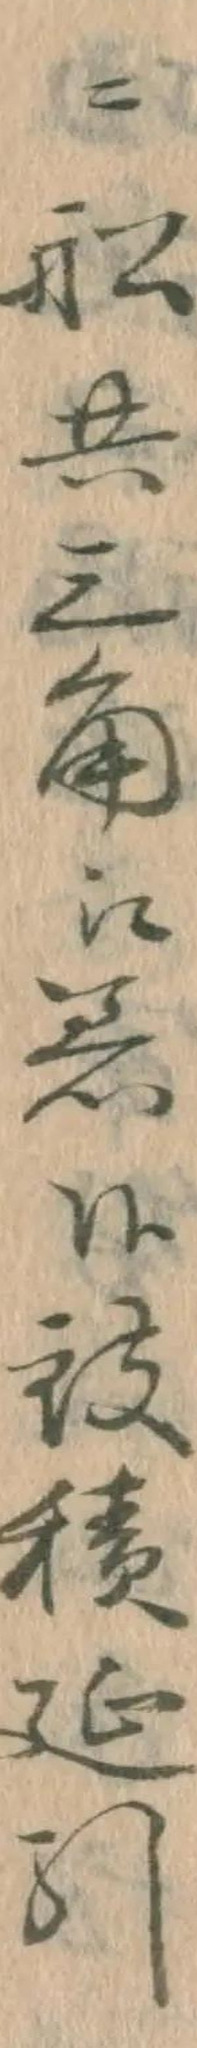に船共三角江着候致積延引
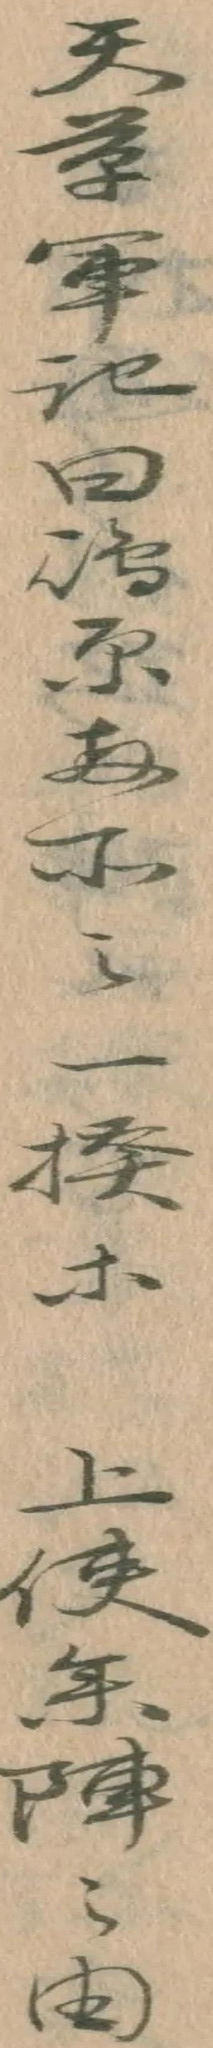天草軍記曰島原両所之一揆等上使参陣之由
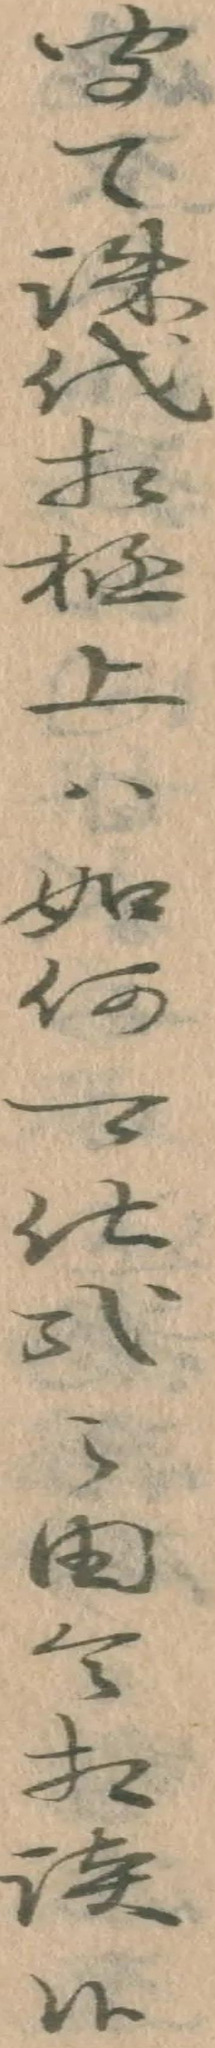聞て誅伐相極上は如何可仕哉之由令相談候
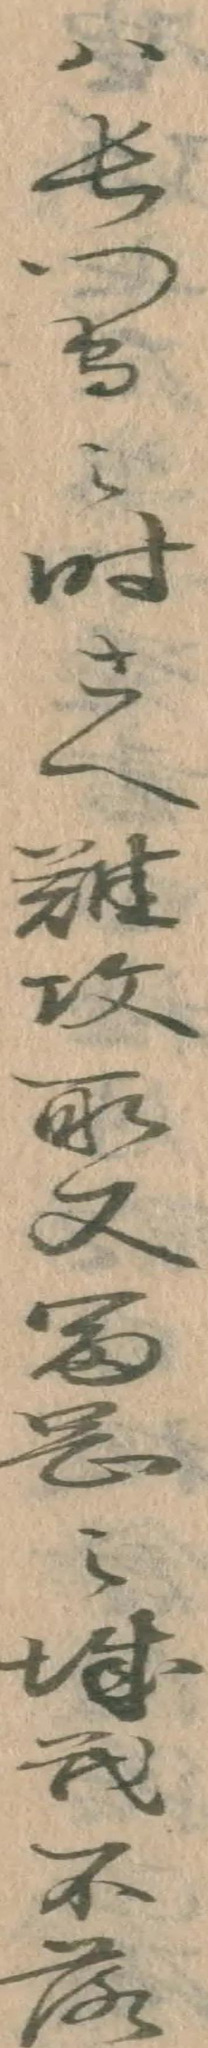は長門守之時さへ難攻所又富岡之城も不落
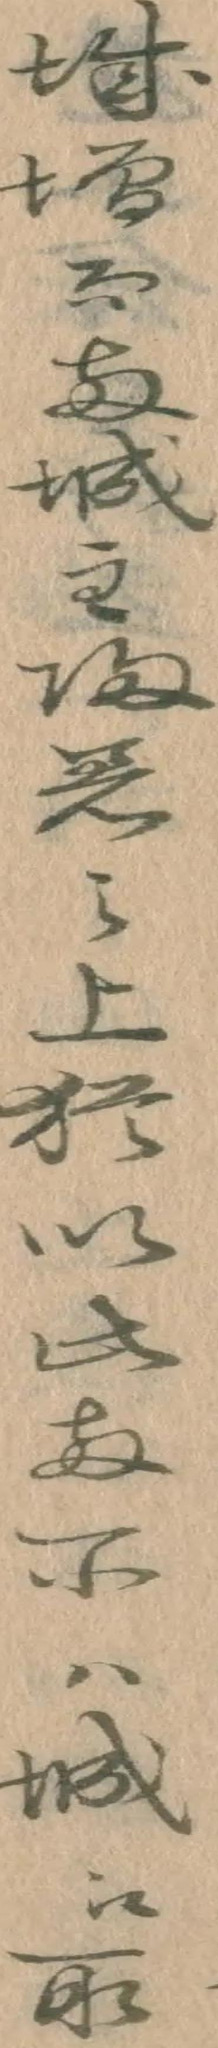城増而両城主帰着之上猶以此両所は城江取
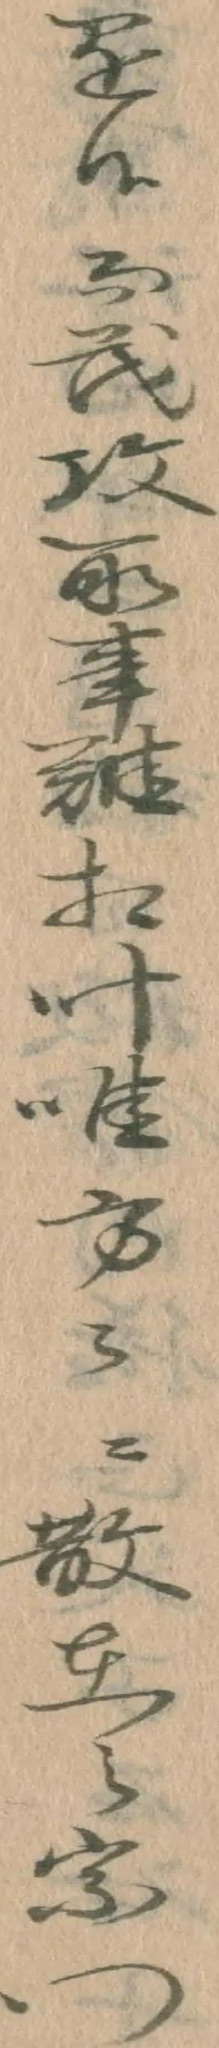懸候而も攻取事難相叶唯方々に散在之宗門
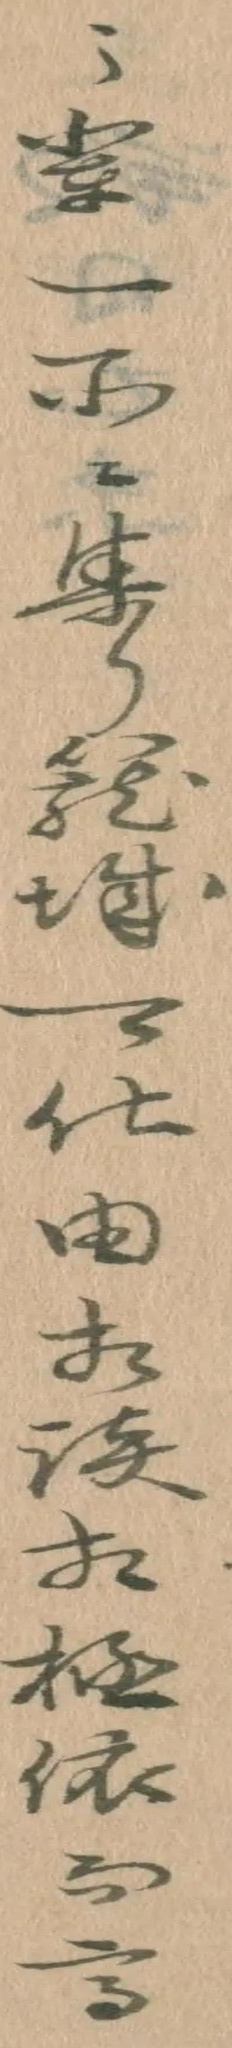之輩一所に集り籠城可仕由相談相極依而高
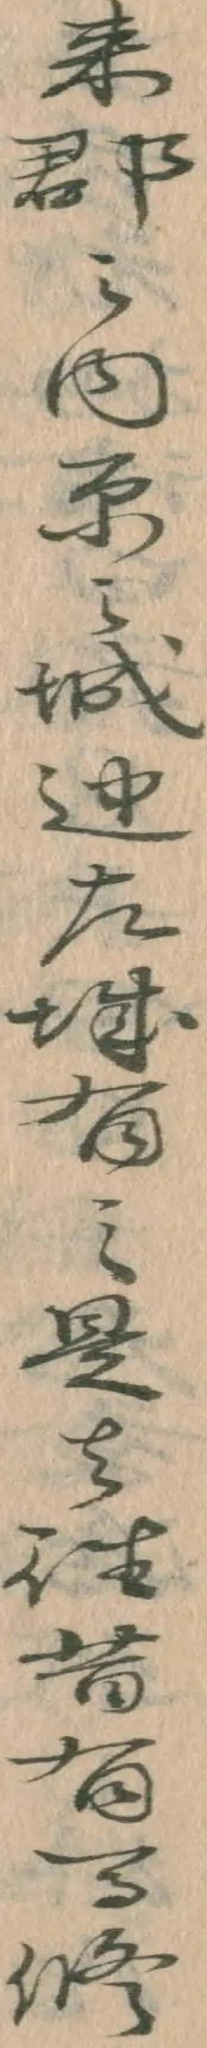来郡之内原之城迚左城有之是は往昔有馬修
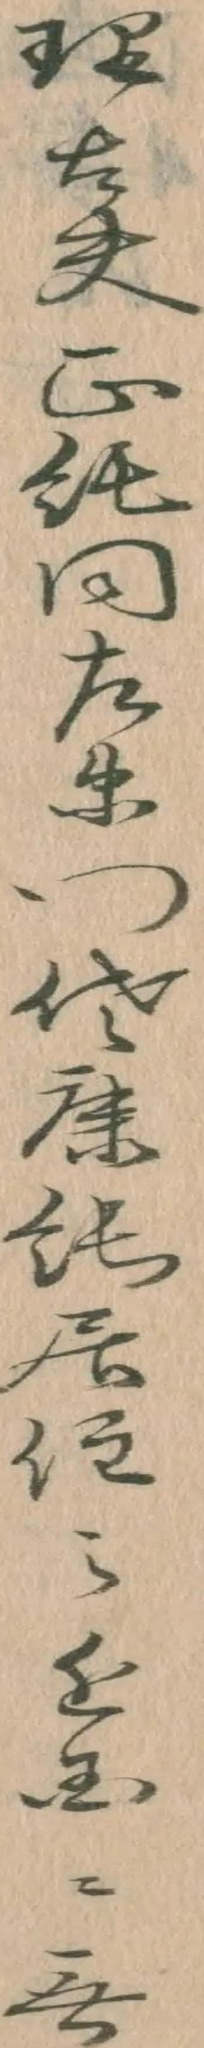理太夫正純同左衛門佐康純居住之近国に無
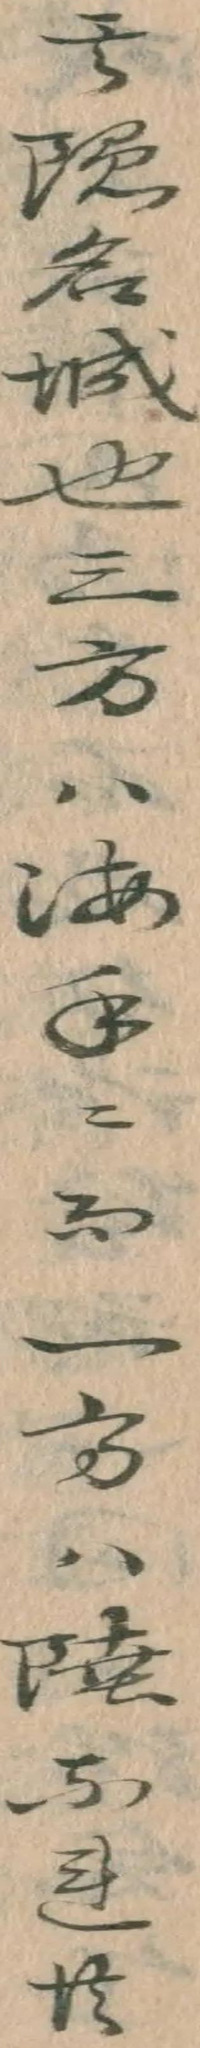其隠名城也三方は海手に而一方は陸なれ共
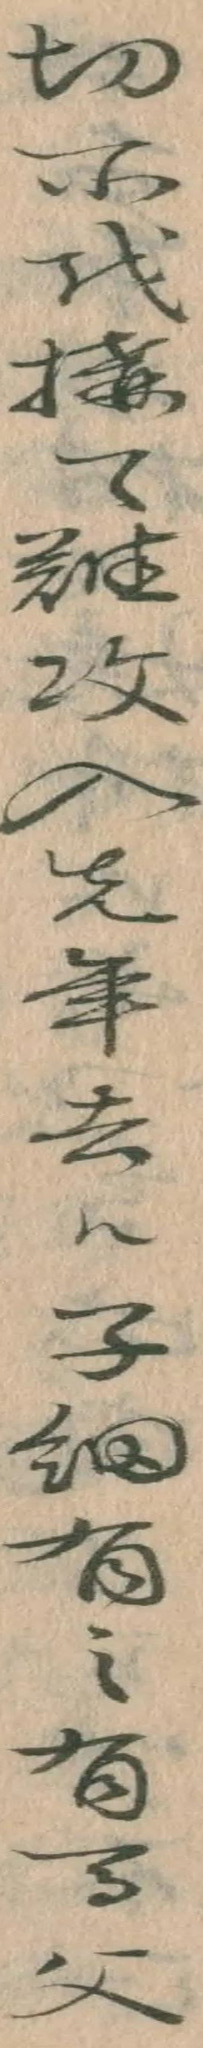切所を構て難攻入先年去る子細有之有馬父
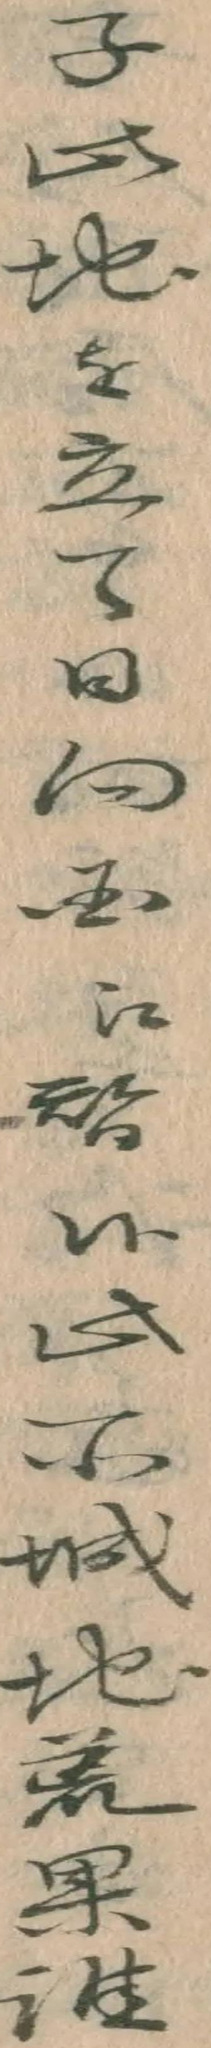子此地を立て日向国江替候此所城地荒果誰
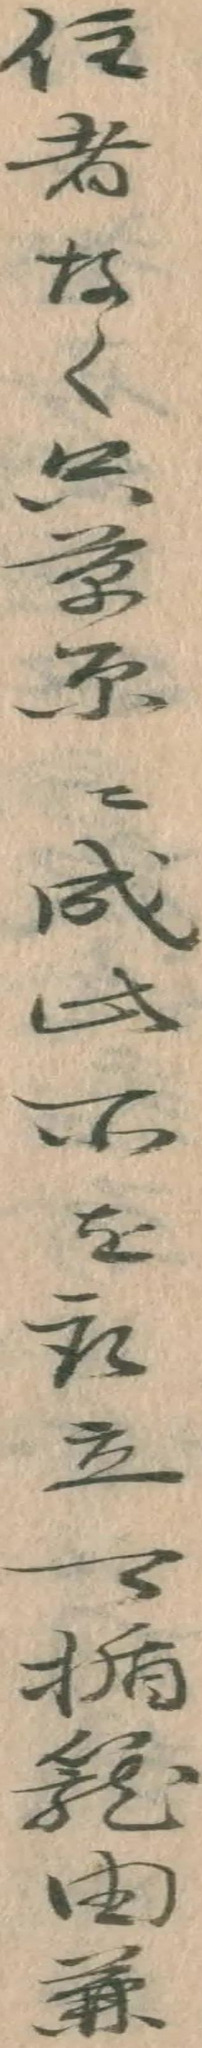住者なく只草原に成此所を取立可楯籠由兼
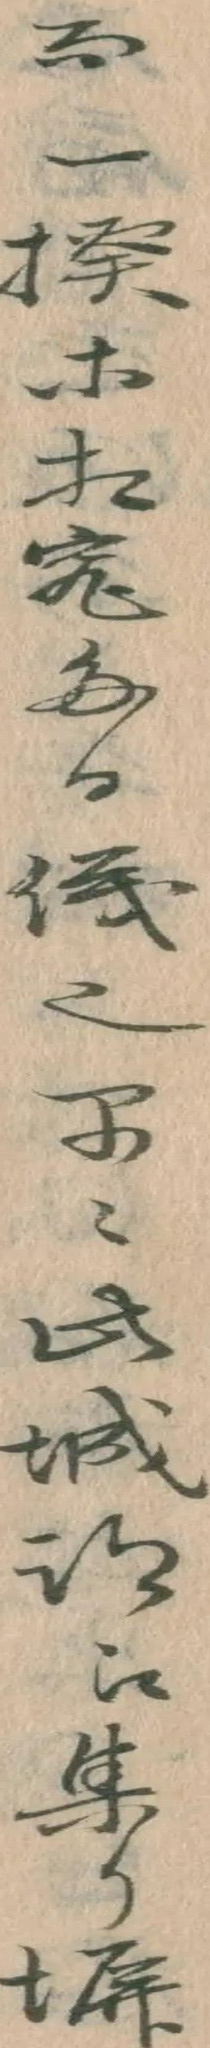而一揆等相究たる儀也早々此城跡江集り塀
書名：切支丹御退治記 49巻. [3]
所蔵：国立国会図書館 National Diet Library, JAPAN
